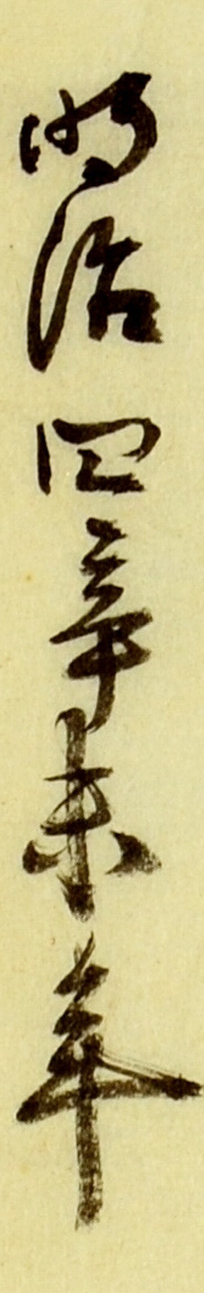明治四辛未年
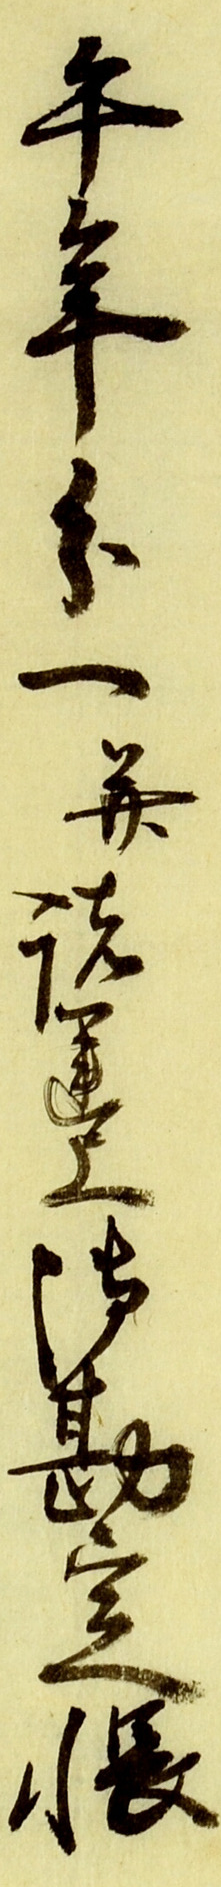午年分一并諸運上御勘定帳
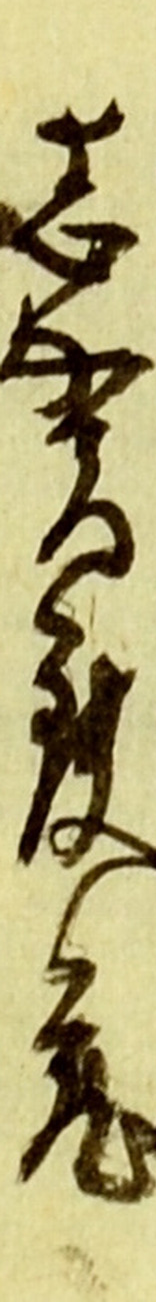志賀鉄蔵
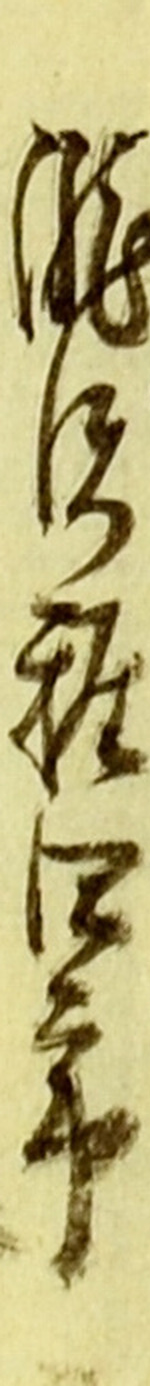瀧沢権四郎
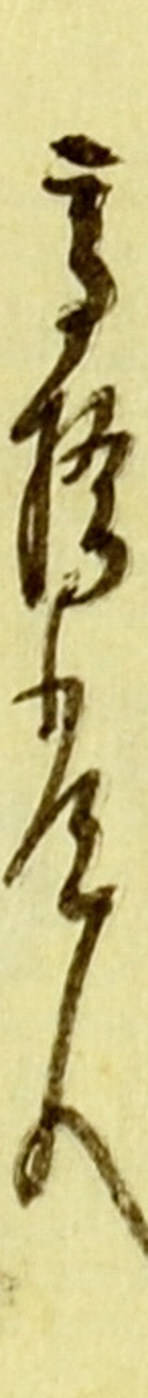高橋常人
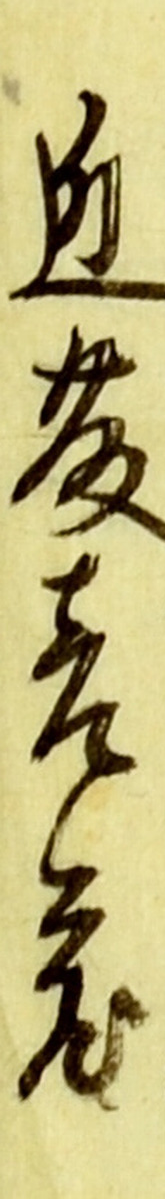近藤吉蔵

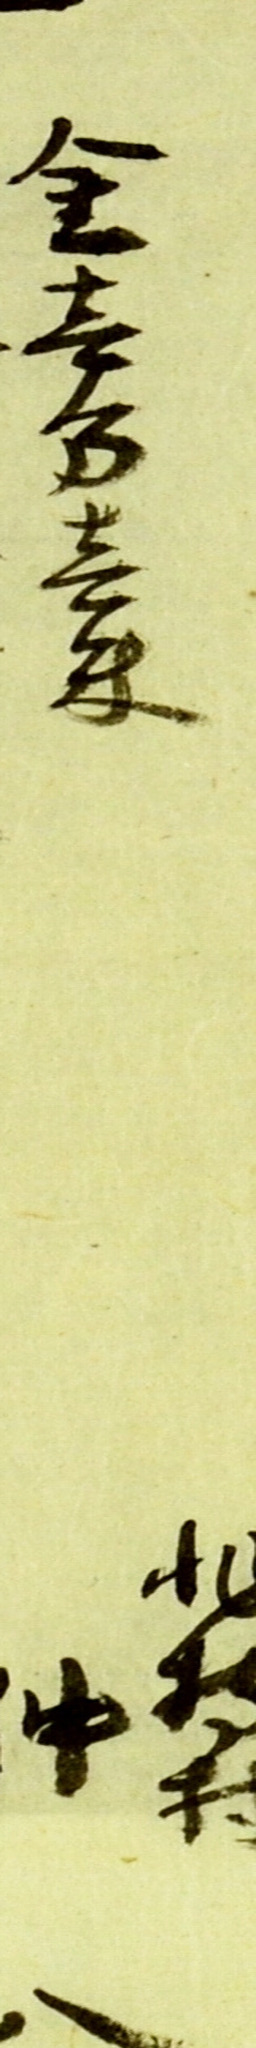一金壱分壱朱非持村
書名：午年分一并諸運上御勘定帳
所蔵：伊那市立高遠町図書館・合同会社AMANE
